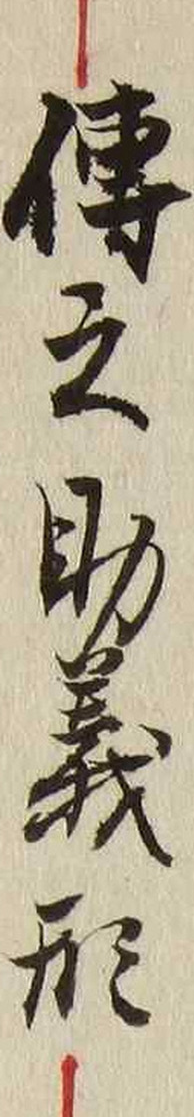伝之助義形
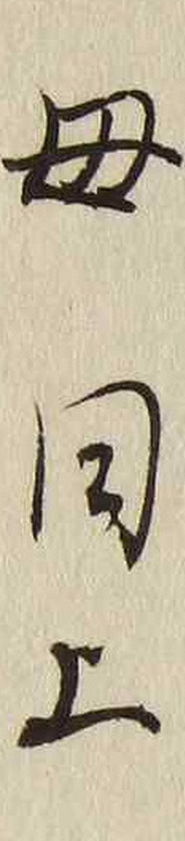母同上

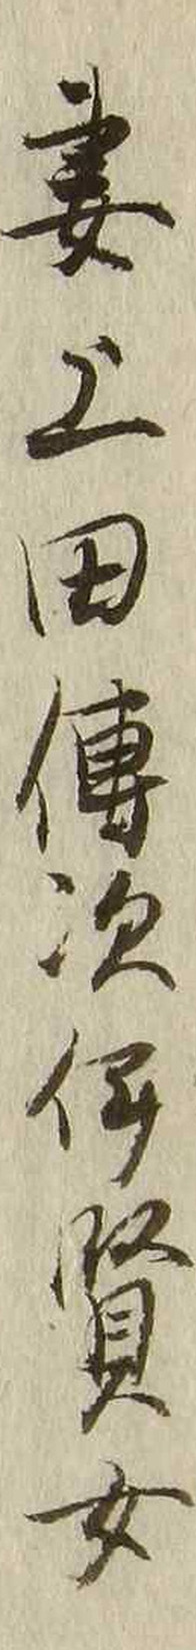妻上田伝次伊賢女
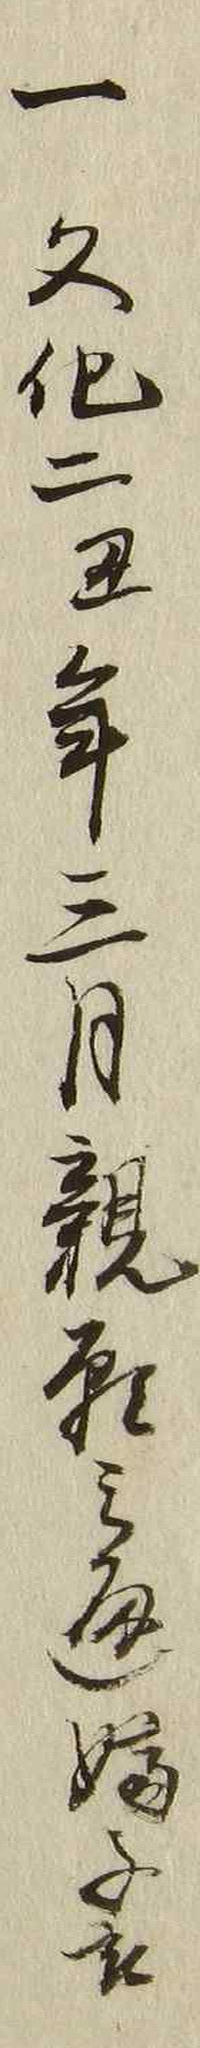一文化二丑年三月親願之通嫡子被
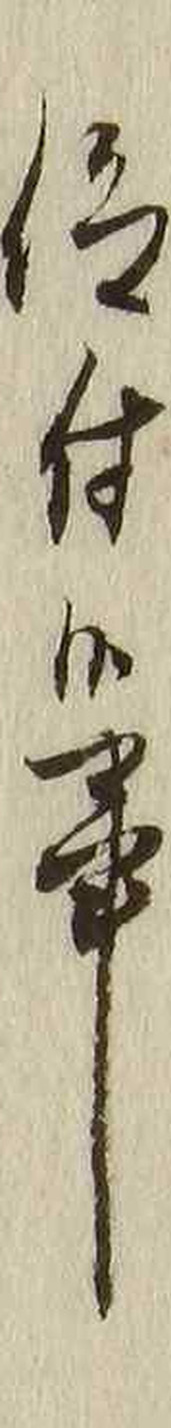仰付候事
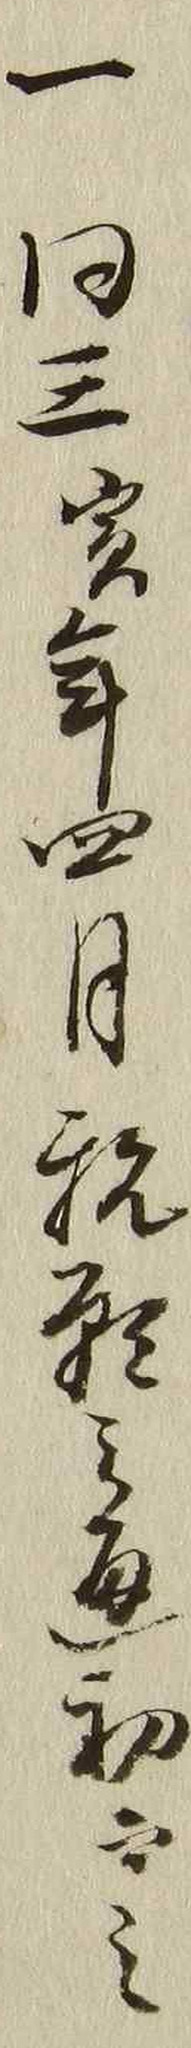一同三寅年四月親願之通初而之
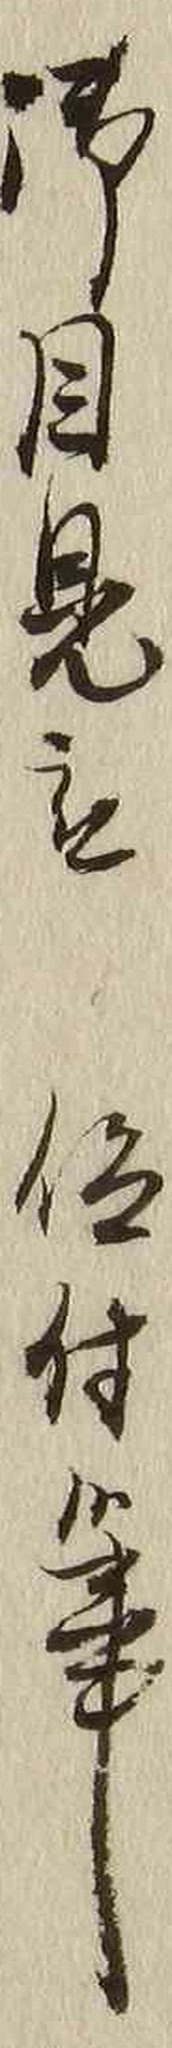御目見被仰付候事
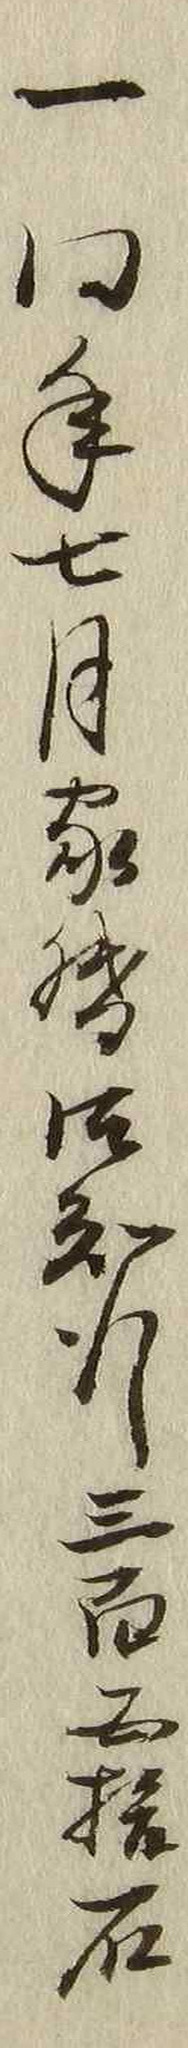一同年七月家督御知行三百五拾石
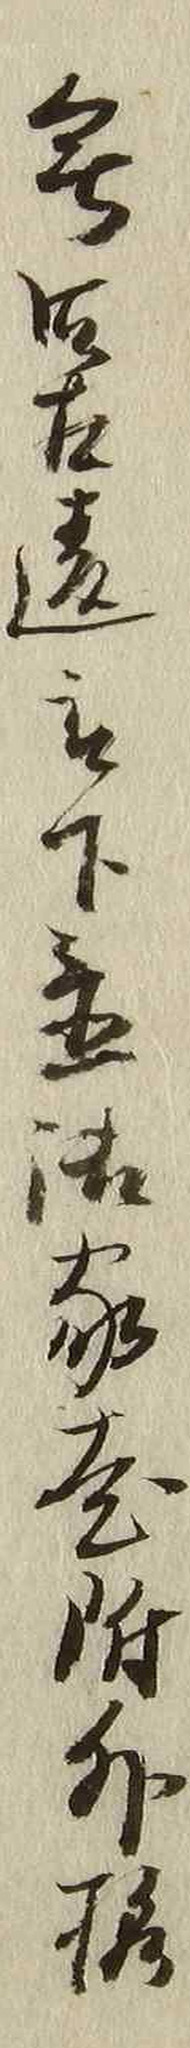無御相違被下置御家老附外様
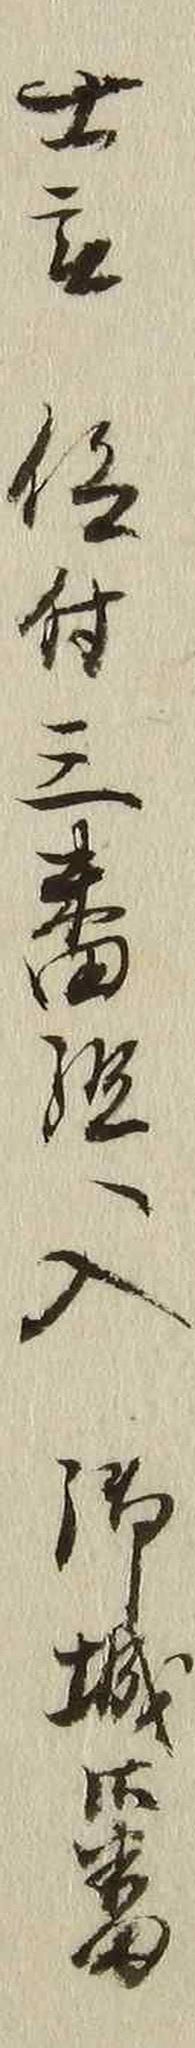士被仰付三番組へ入御城御番
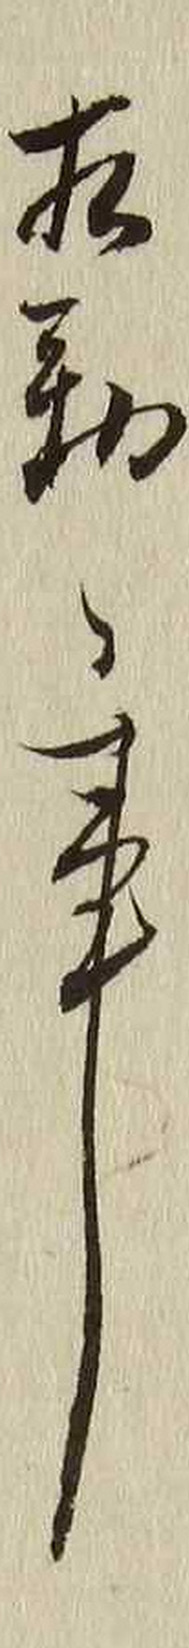相勤候事
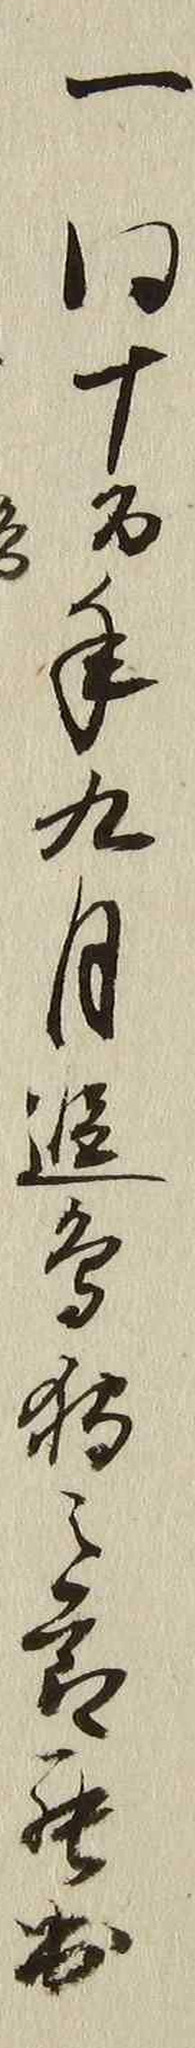一同十酉年九月追鳥狩之節罷出
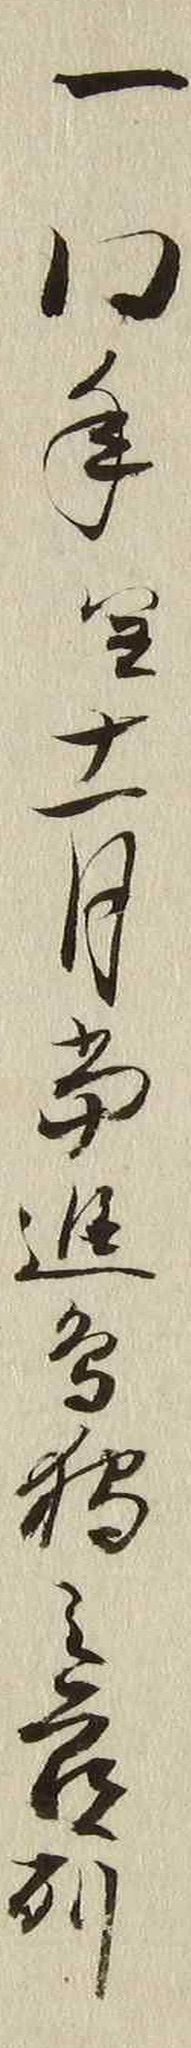一同年閏十一月当追鳥狩之節列
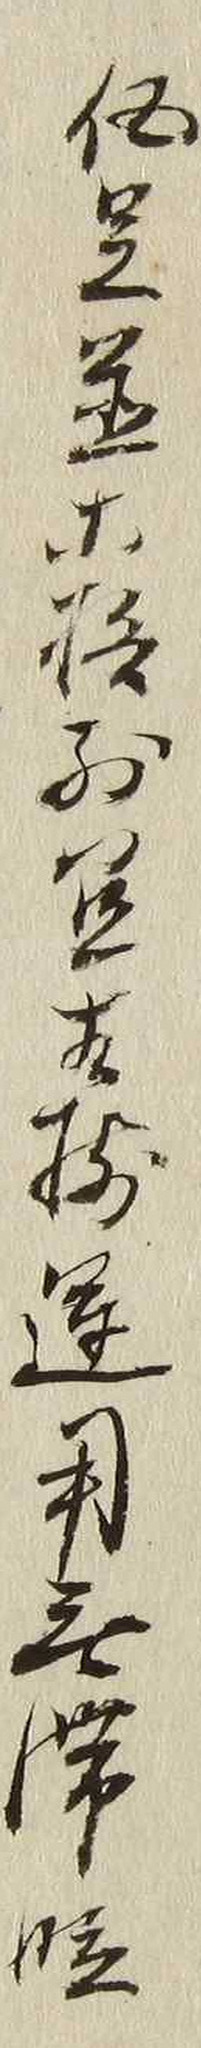伍足並等格別宜相揃運用無滞段
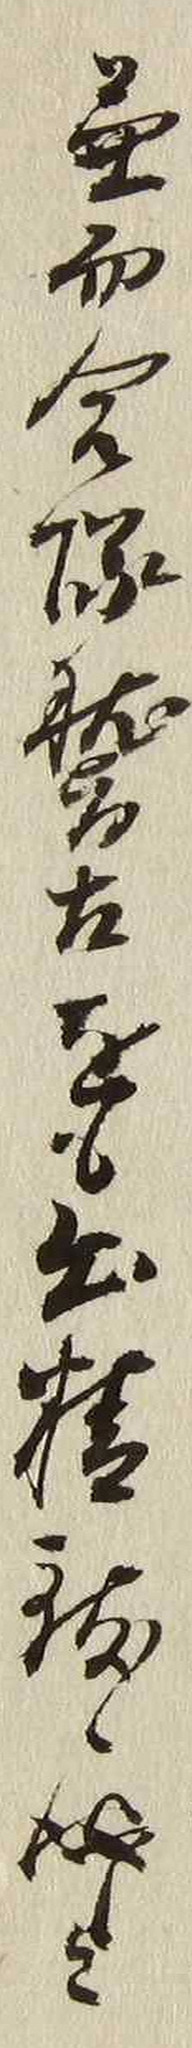兼而合隊稽古をも出精致候儀与
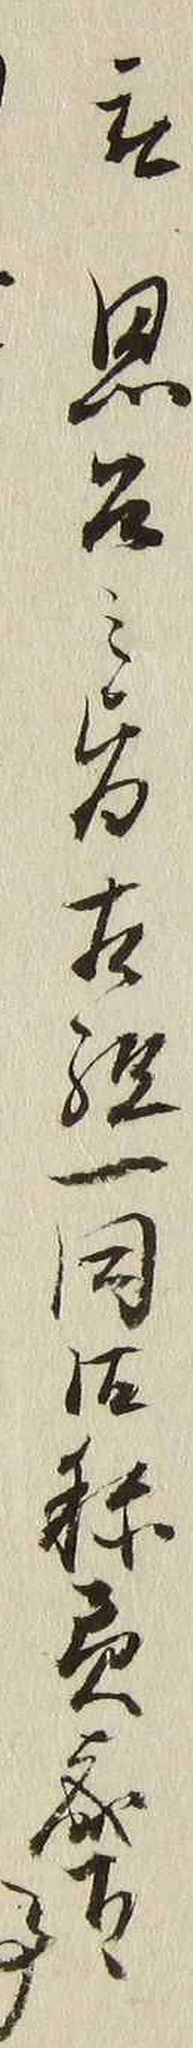被思召之旨相組一同御称美被成下候事
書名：諸士系譜　巻之348　も之部4
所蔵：会津若松市立会津図書館
